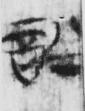訟
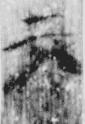亓（其）
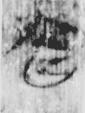官
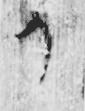人
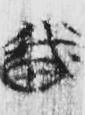番
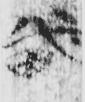番
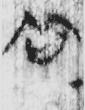向
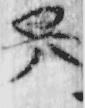{日亓}（期）
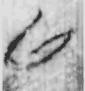㠯（以）
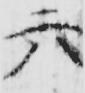亓
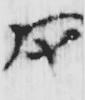反
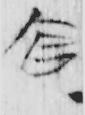官
